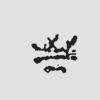至
